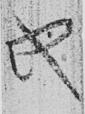母
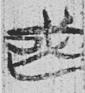或（惑）
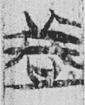者（諸）
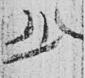少（小）
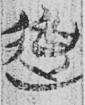道
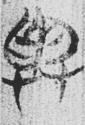與（歟）
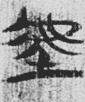○（吾）
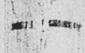一
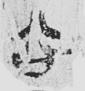谷（欲）
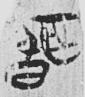○（聞）
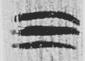三
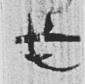弋（代）
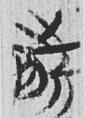之所
